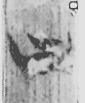曰
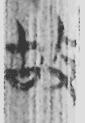故
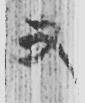又
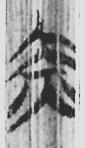赤
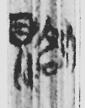{鳥咎}
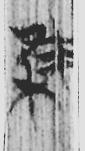集
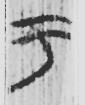于
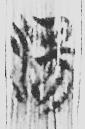湯
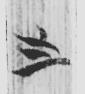之
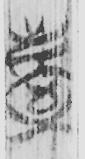{鹿至}
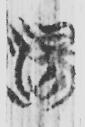湯
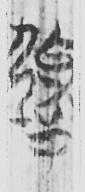{弓夬矢}
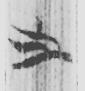之
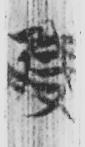雘
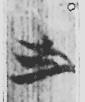之
